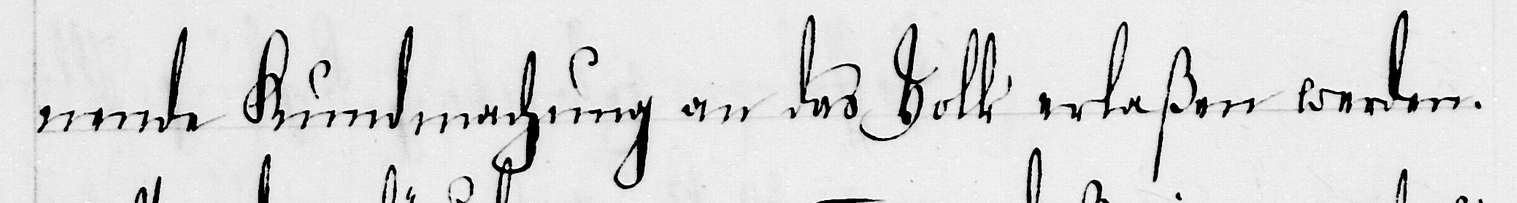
nende Kundmachung an das Volk erlaßen werden.
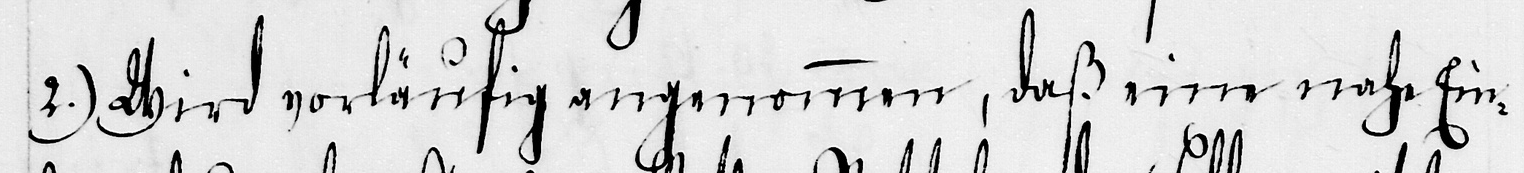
2.) Wird vorläufig angenommen, daß eine nahe Ein¬
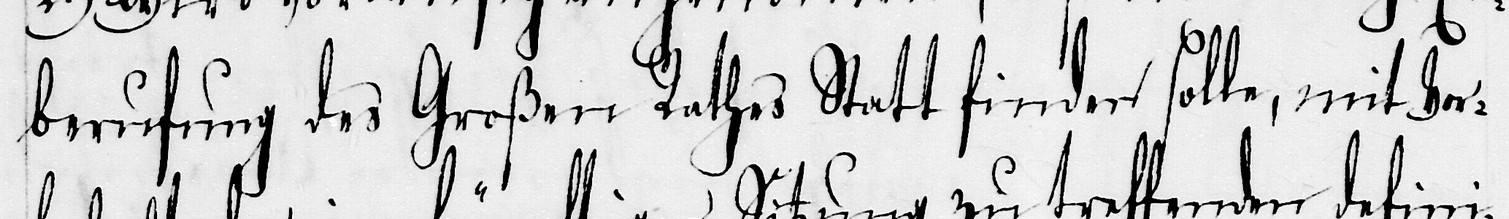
berufung des Großen Rathes Statt finden solle, mit Vo¬
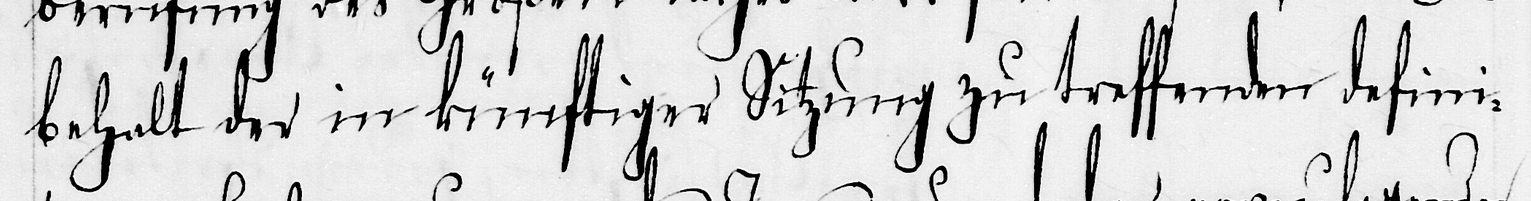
rbehalt der in künftiger Sitzung zu treffenden defini¬
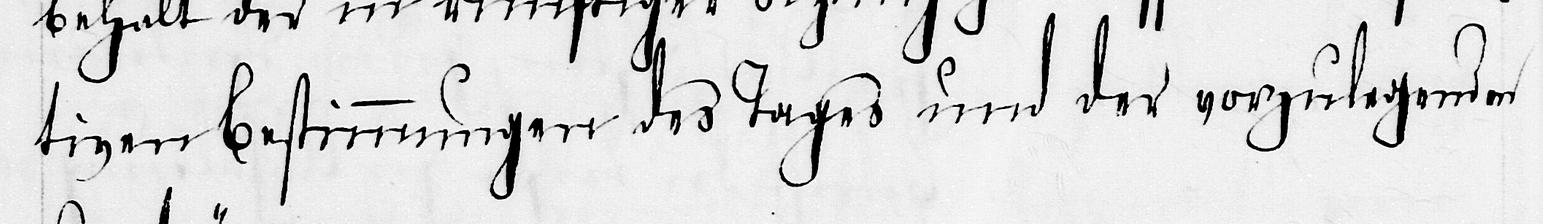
tiven Bestimmungen des Tages und der vorzulegenden
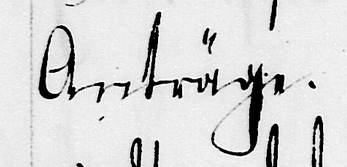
Anträge.
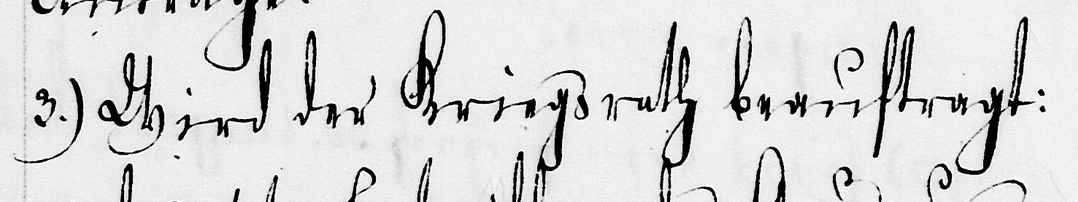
3.) Wird der Kriegsrath beauftragt:
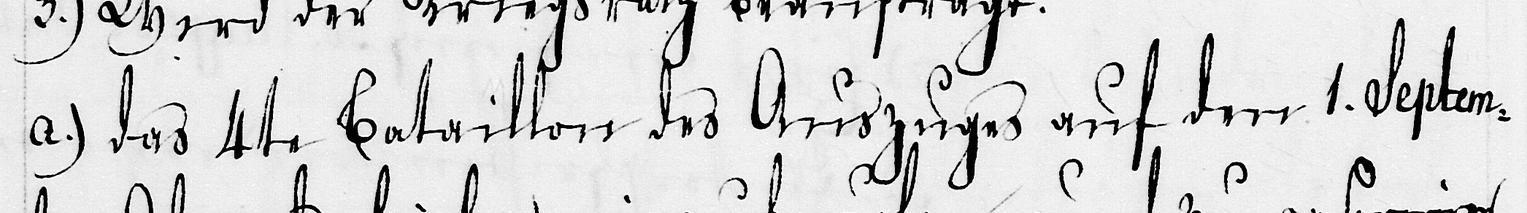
a.) das 4te Bataillon des Auszuges auf den 1. Septem¬
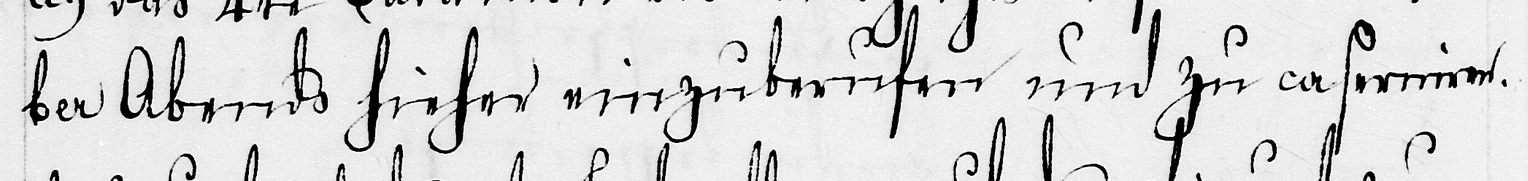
ber Abends hieher einzuberufen und zu caserniren.
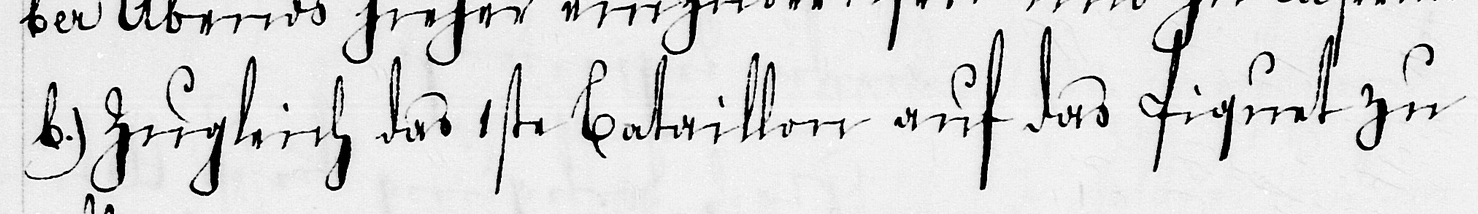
b.) Zugleich das 1ste Bataillon auf das Piquet zu
